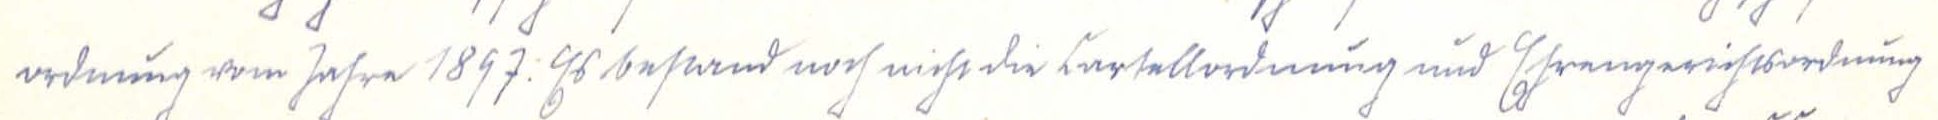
ordnung vom Jahre 1897. Es bestand noch nicht die Cartellordnung und Ehrengerichtsordnung
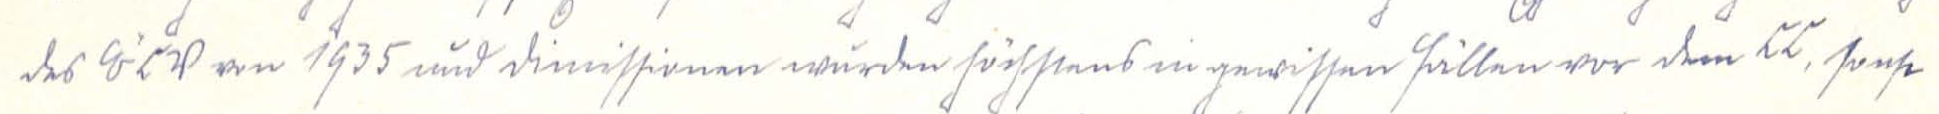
des ÖCV von 1935 und Dimissionen wurden höchstens in gewissen Fällen von dem CC sonst
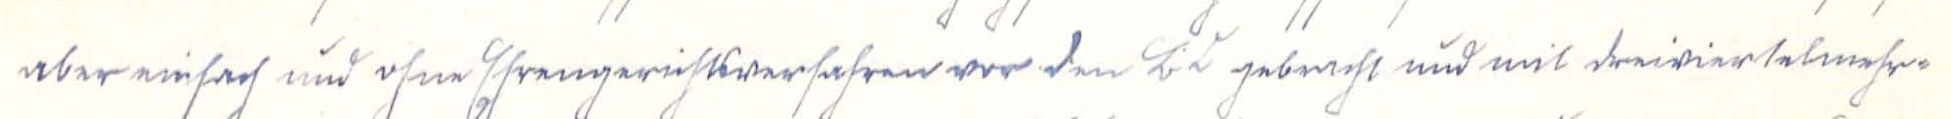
aber einfach und ohne Ehrengerichtsverfahren vor den BC gebracht und mit dreiviertelmehr-
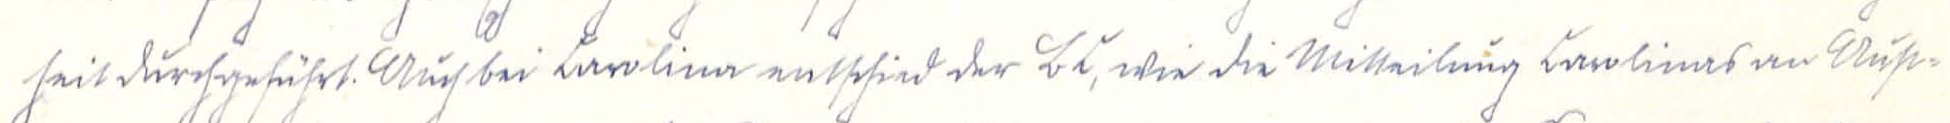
heit durchgeführt. Auch bei Carolina entschied der BC, wie die Mitteilung Carolinas an Aust-
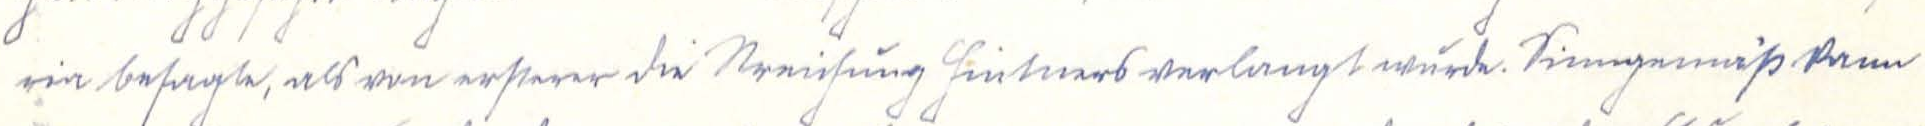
ria besagte, als ersteren die Streichung Hintners verlang wurde. Sinngemäß kann
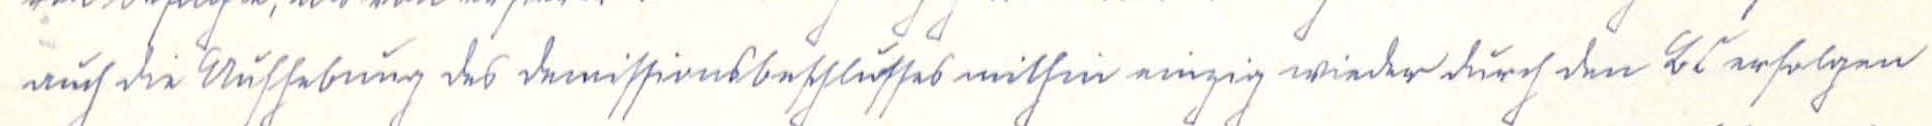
auf die Aufhebung des Dimissionsbeschlusses mithin einzig wieder durch den BC erfolgen
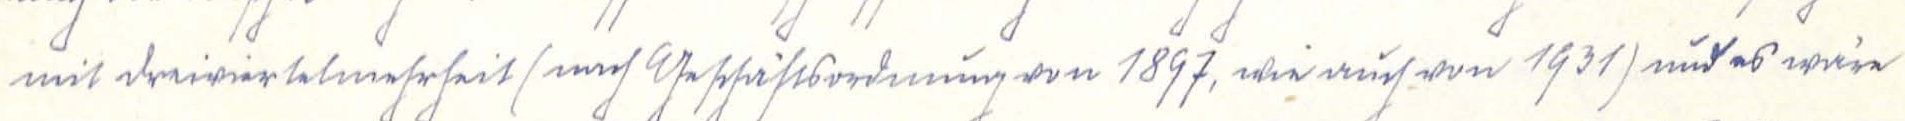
mit dreiviertelmehrheit (nach Geschäftsordnung von 1897, wie auch von 1931) und es wäre
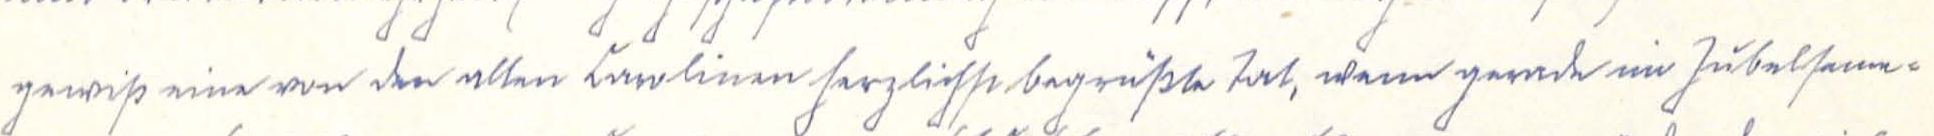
gewiß eine von den alten Carolinen herzlichst begrüßte Tat wenn gerade im Jubelseme-
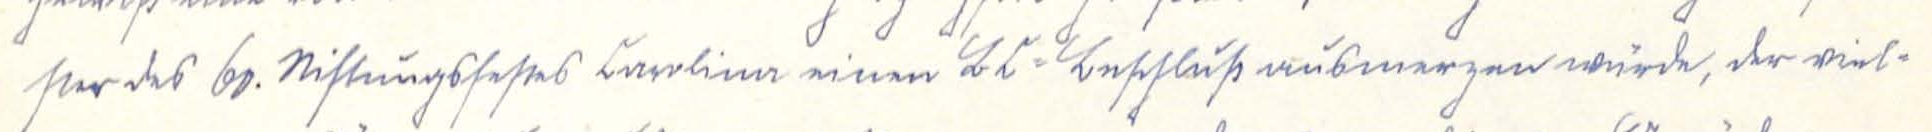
ster des 60. Stiftungsfestes Carolina einen BC-Beschluß ausmerzen würde, der viel-
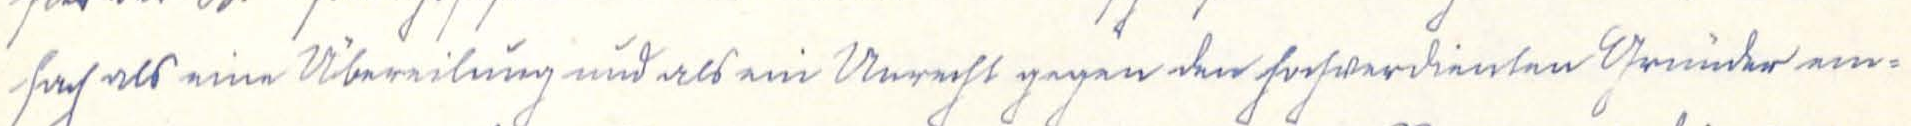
fach als eine Übereilung und als ein Unrecht gegen den hochverdienten Gründer em-
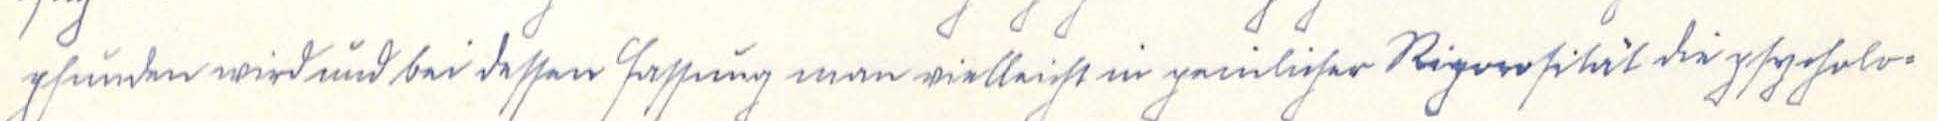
pfunden wird und bei dessen Fassung man vielleicht in peinlicher Rigorosität die psycholo-
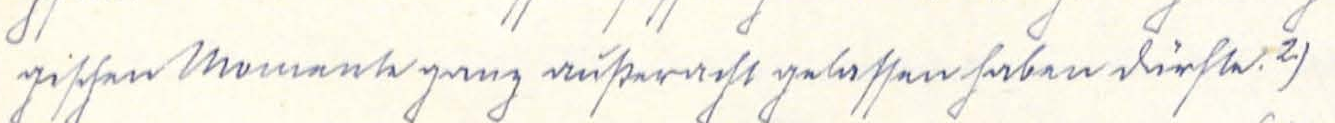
gischen Momente ganz außeracht gelassen haben dürfen. 2.)
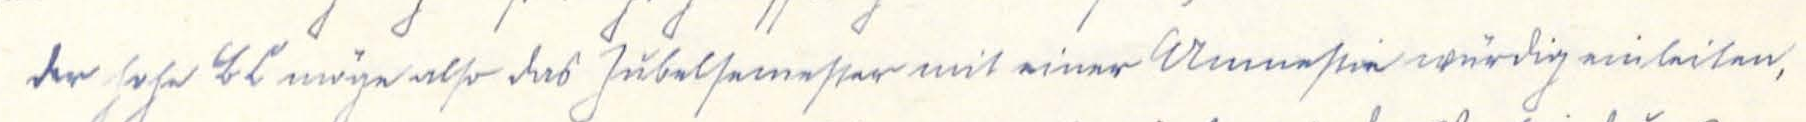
Der hohe BC möge also das Jubelsemester mit einer Amnestie würdig einleiten,
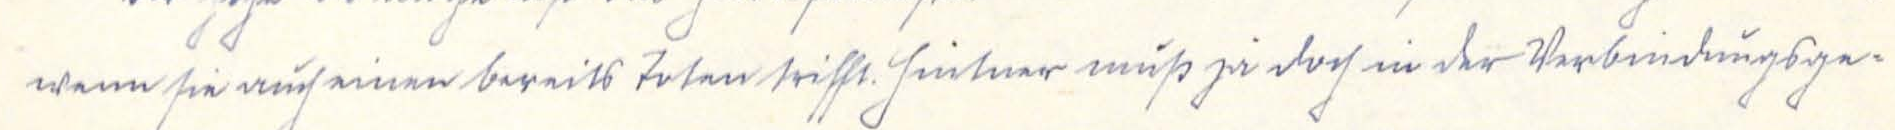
wenn sie auch einen bereits Toten trifft. Hintner muß ja doch in der Verbindungsge-
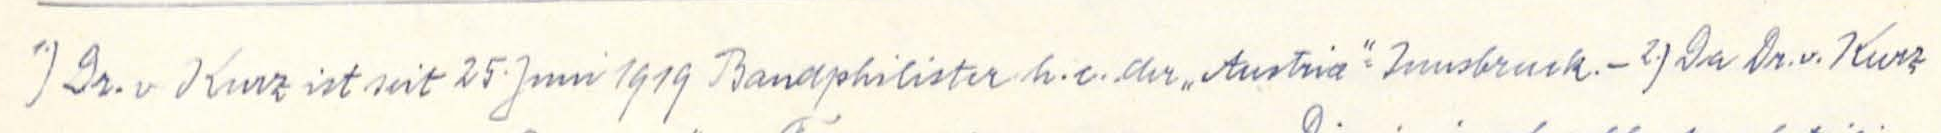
Dr. v. Kurz ist seit 25. Juli 1919 Bandphilister h.c. der "Austria"-Innsbruck.- 2.) Da Dr. v. Kurz
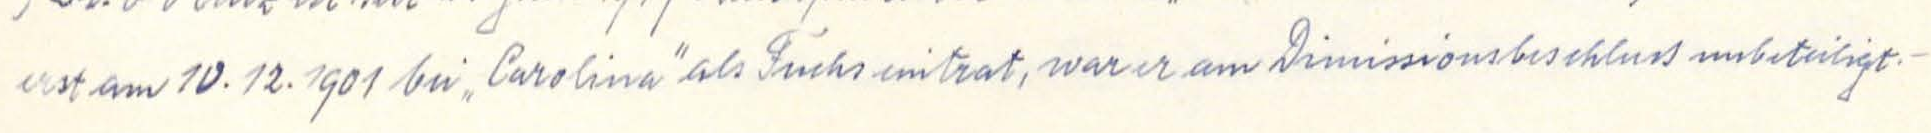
erst am 10. 12. 1901 bei "Carolina" als Fuchs eintrat, war er am Dimissionsbeschluss unbeteiligt.
